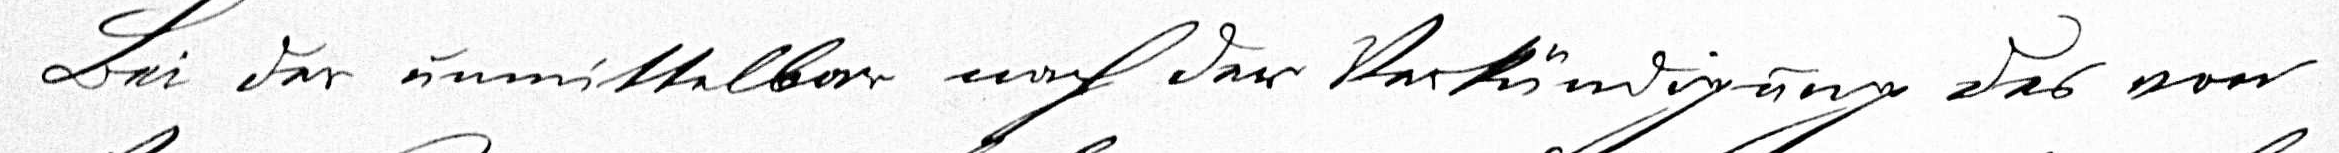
Bei der unmittelbar nach der Verkündigung des von
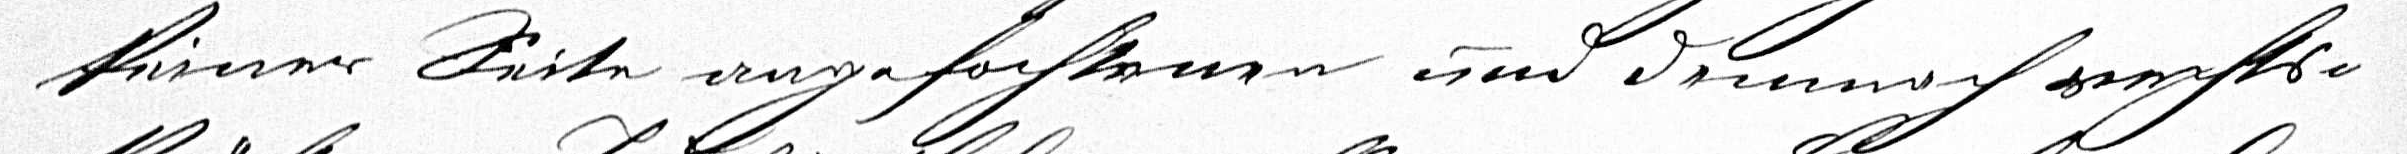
keiner Seite angefochtenen und demnoch rechts¬
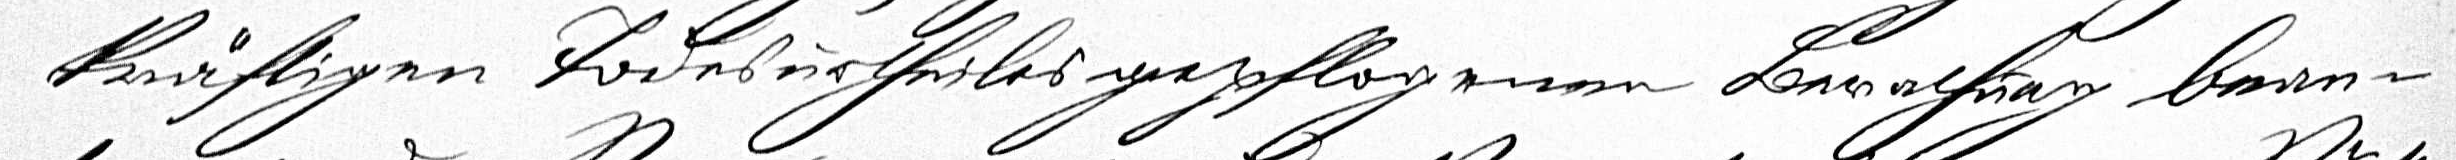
kräftigen Todesurtheiles gepflogenen Berathung bean¬
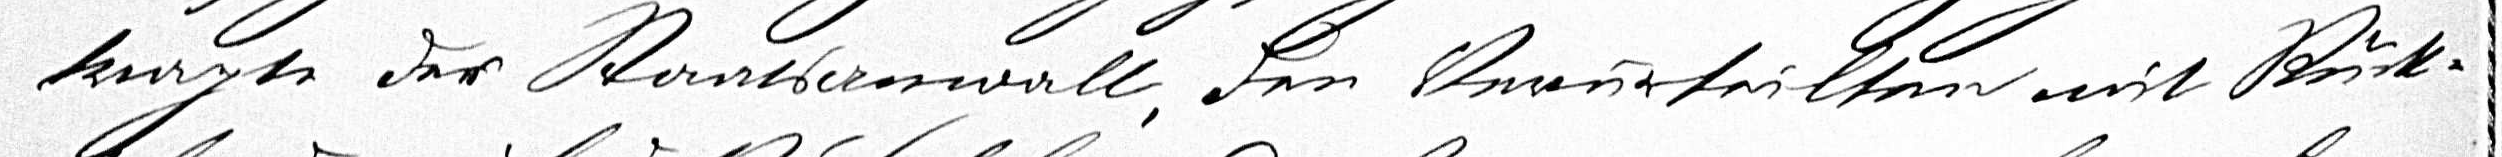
trage der Staatsanwalt, den Verurtheilten mit Rück¬
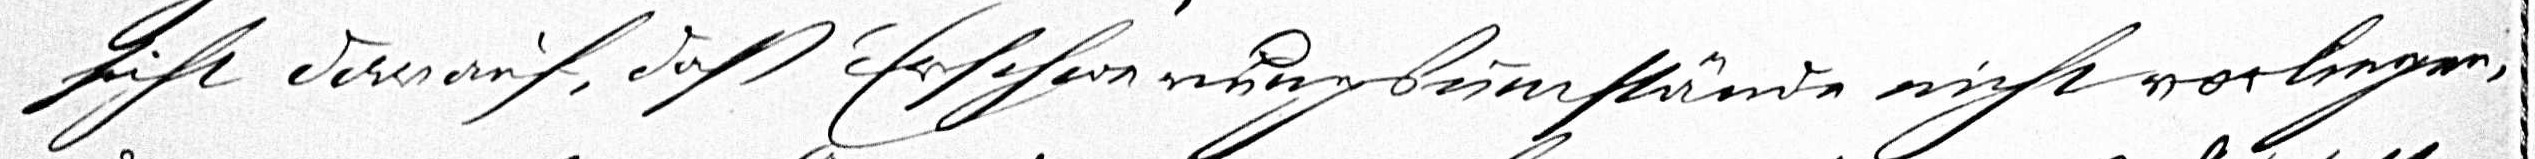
sicht darauf, daß Erschwerungsumstände nicht vorleigen
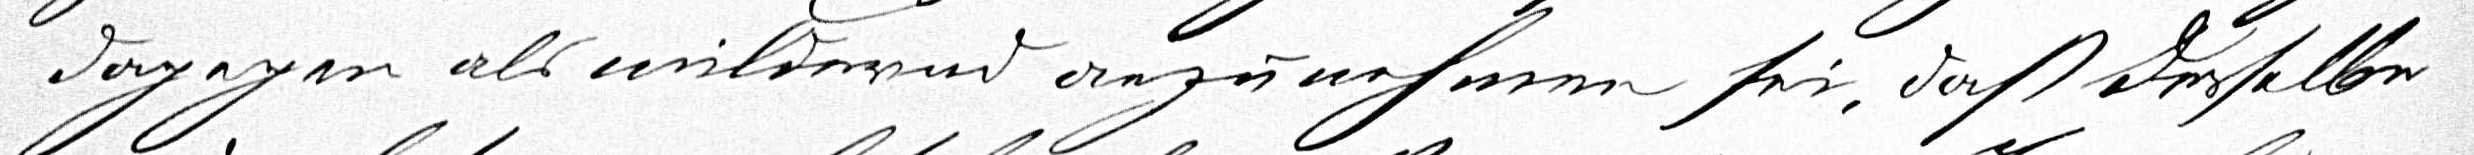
dagegen als mildern anzunehmen sei, daß derselbe
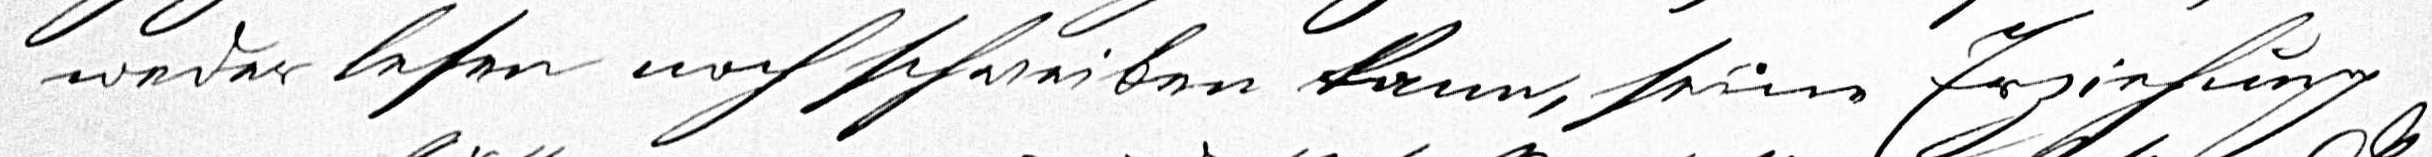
weder lese noch schreiben kann, seine Erziehung
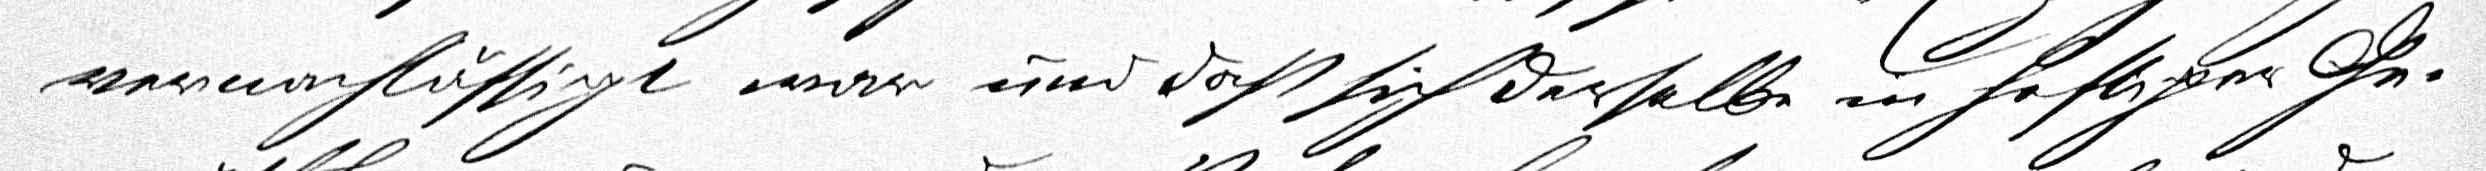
vernachlässigt war und daß sich derselbe in heftiger Ge¬
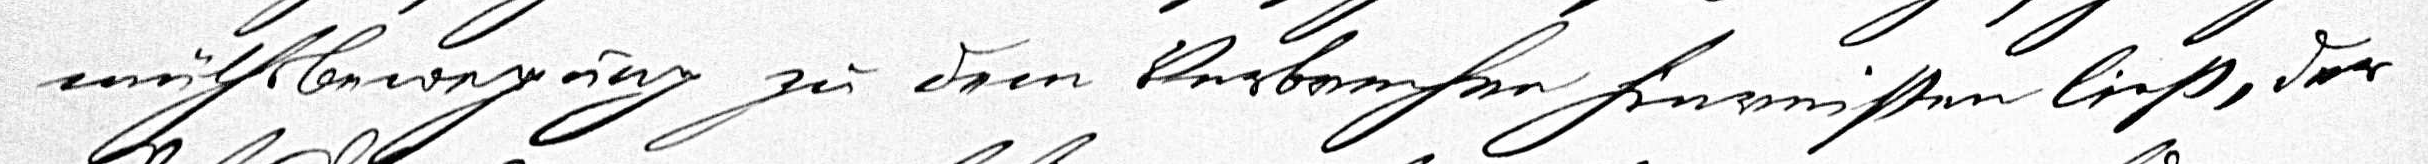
müthsbewegung zu dem Verbrechen hinreißen ließ, der
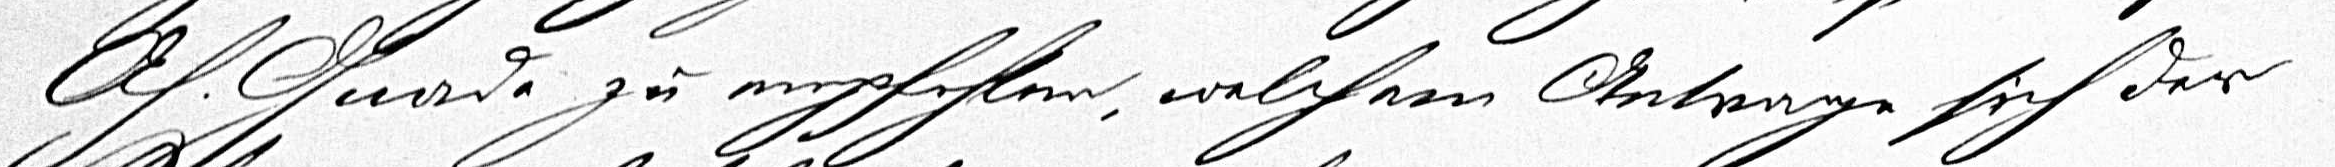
Ah. Gnade zu empfehlen, welchem Antrage sich der
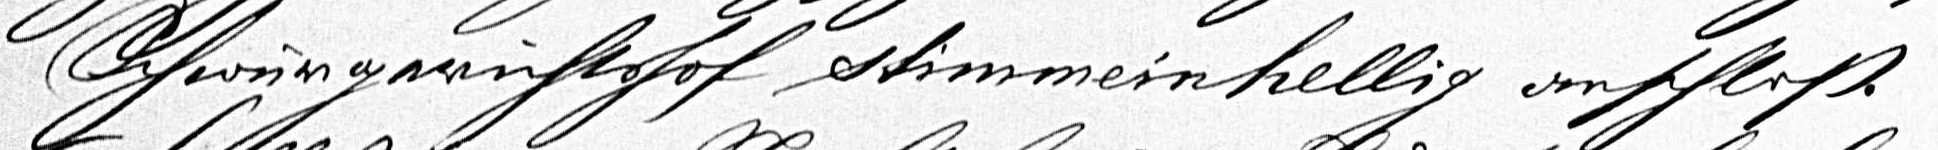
Schurgerichtshof stimmeinhellig anschloß.
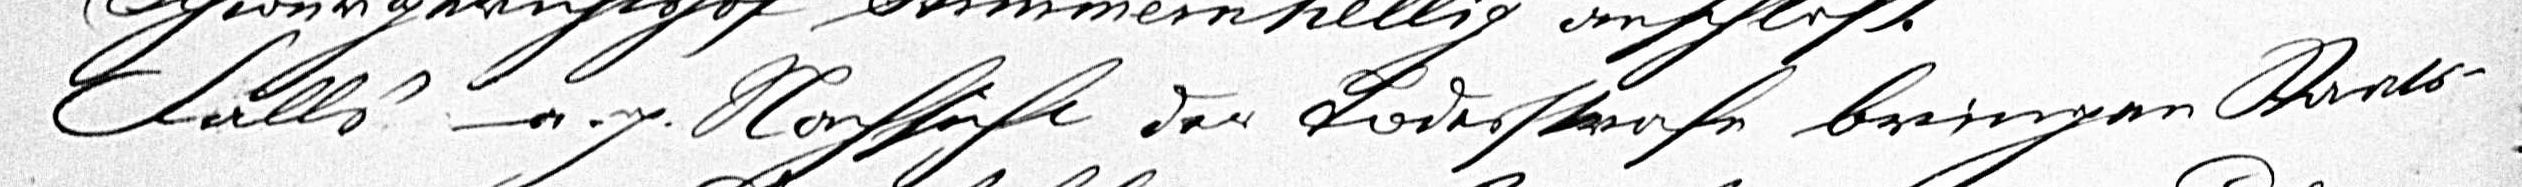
Falls a.g. Nachsicht der Todesstrafe bringen Staats¬
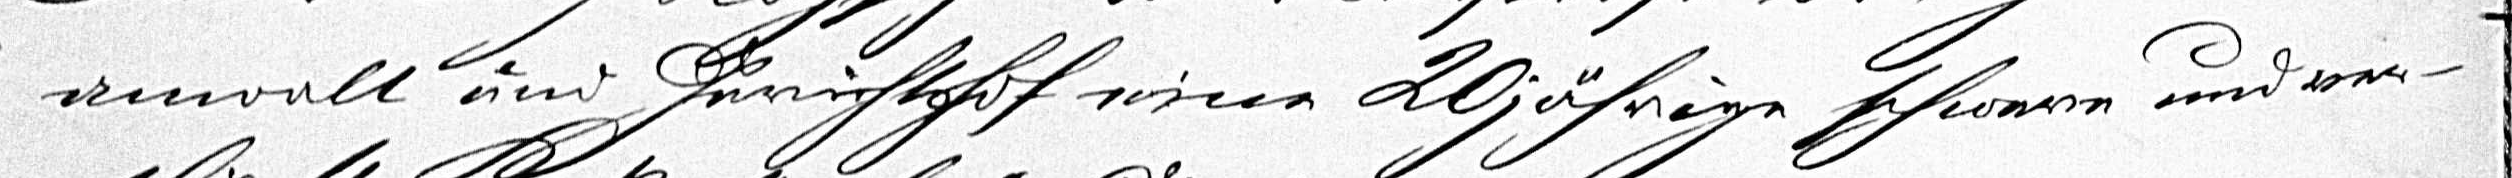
anwalt und Gerichtshof einen 20jährige shcwere und ver¬
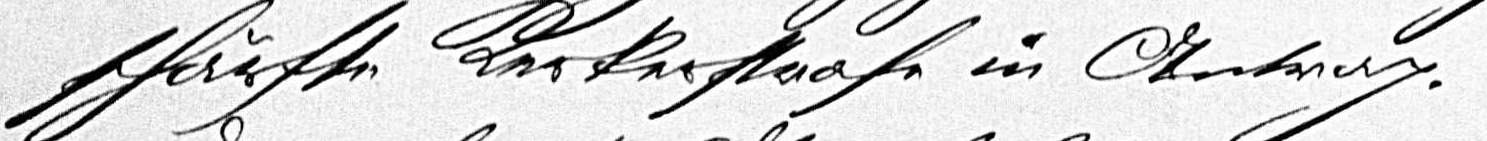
schärfte Kerkerstrafe in Antrag.
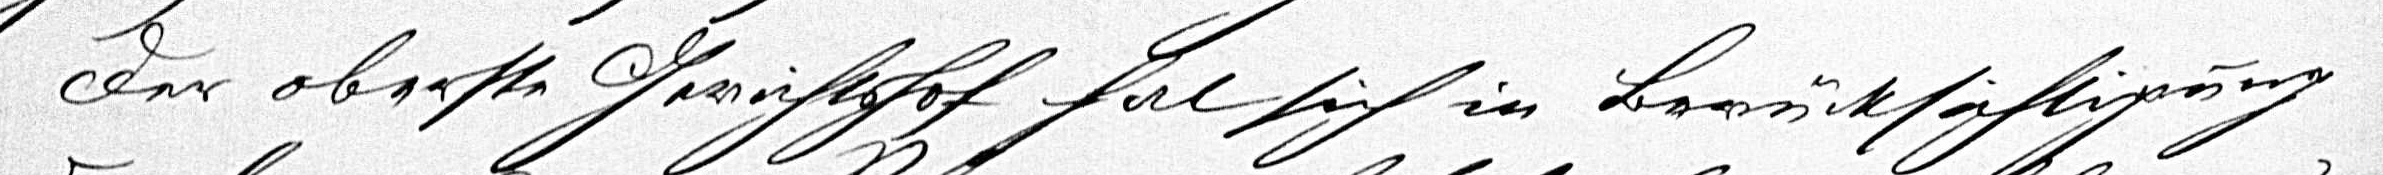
Der oberste Gerichtshof hat sich in Berücksichtigung
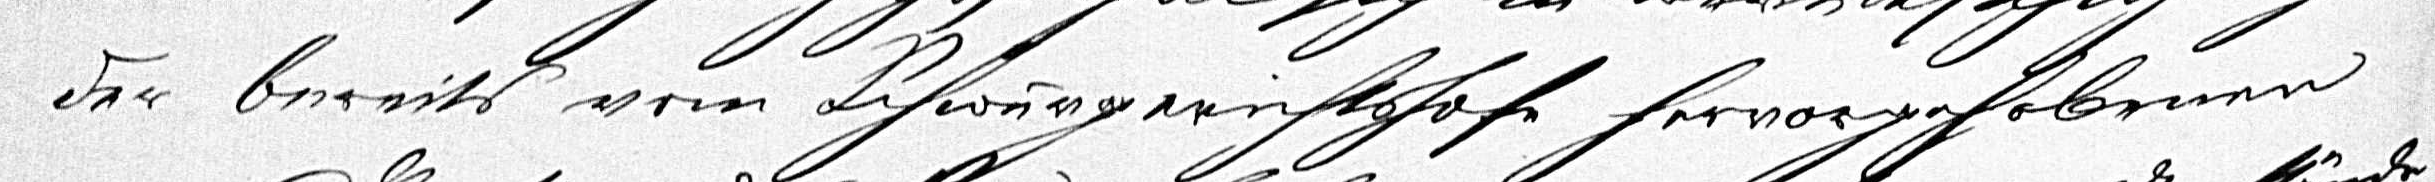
der bereits vom Schwurgerichtshofe hervorgehobenen
